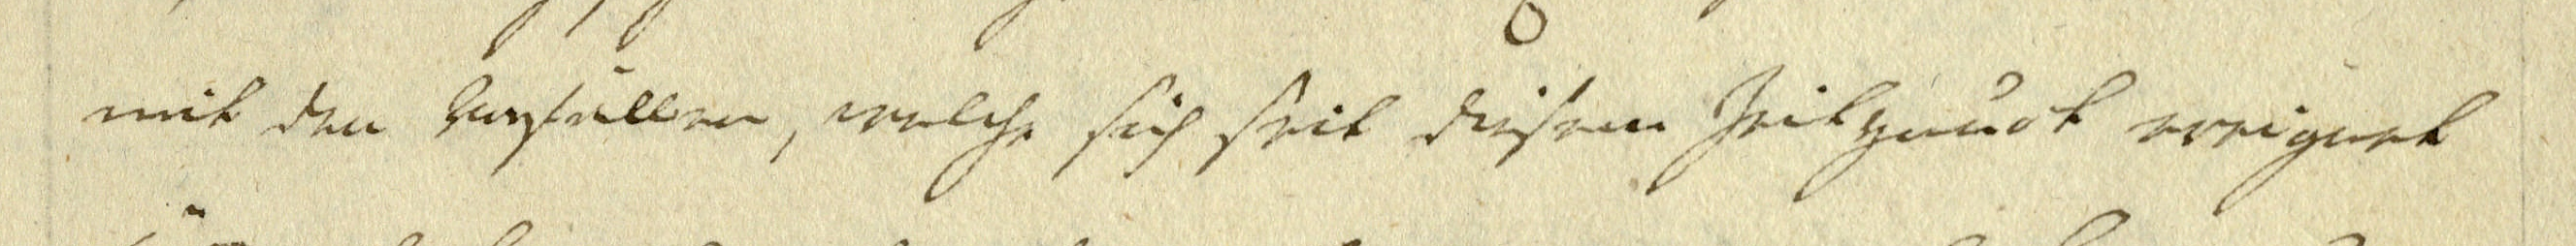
mit den Vorfällen, welche sich seit diesem Zeitpunct ereignet
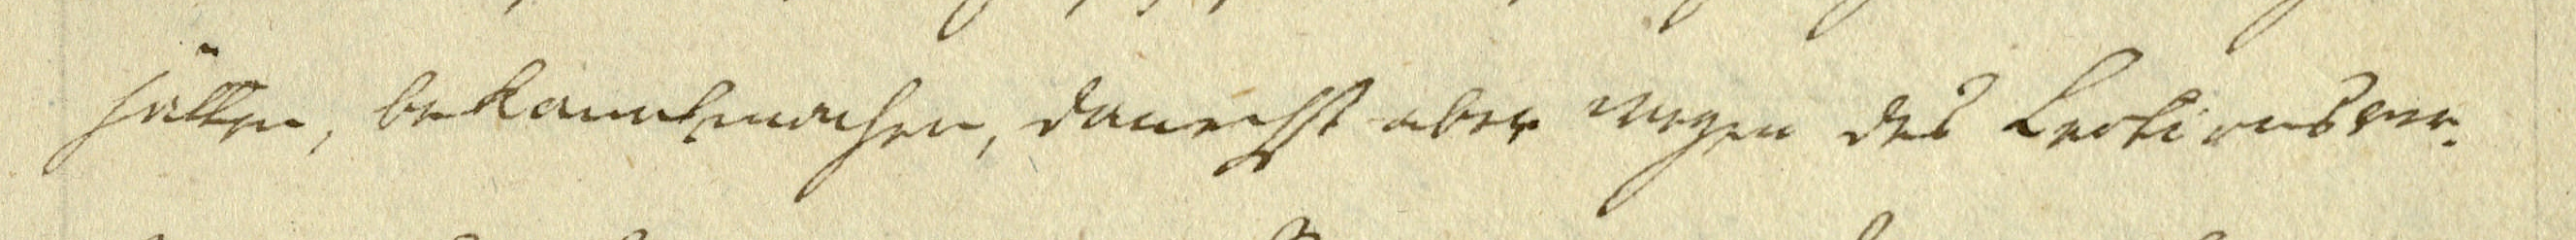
hätten, bekanntmachen, danechst aber wegen des Lectionsver¬
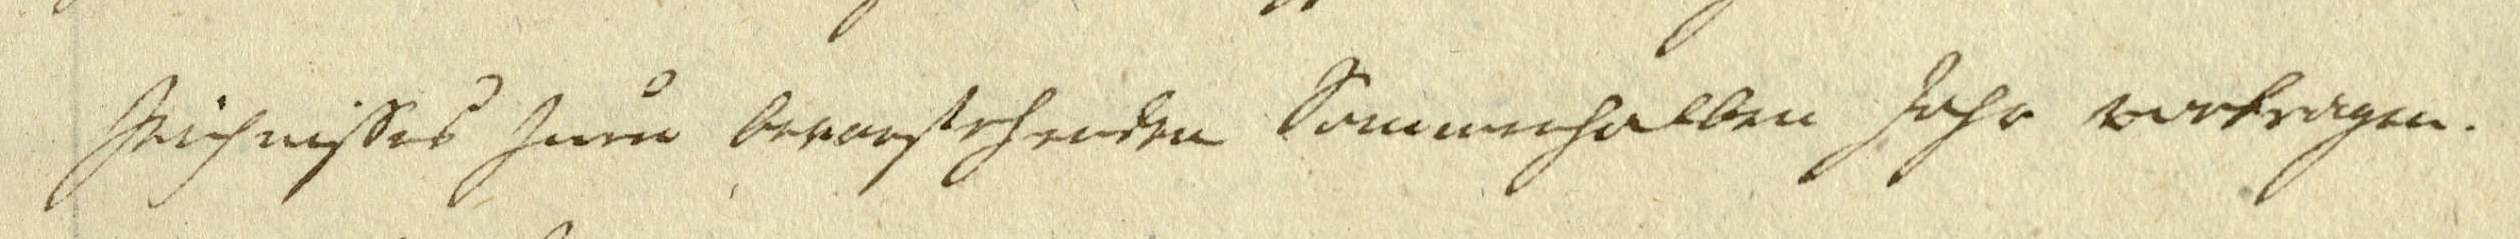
zeichnisses zum bevorstehenden Sommerhalben Jahr vortragen.
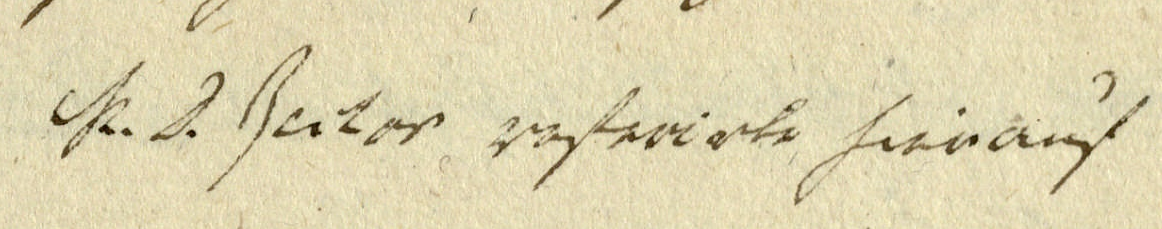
M. D. Rector referirte hierauf
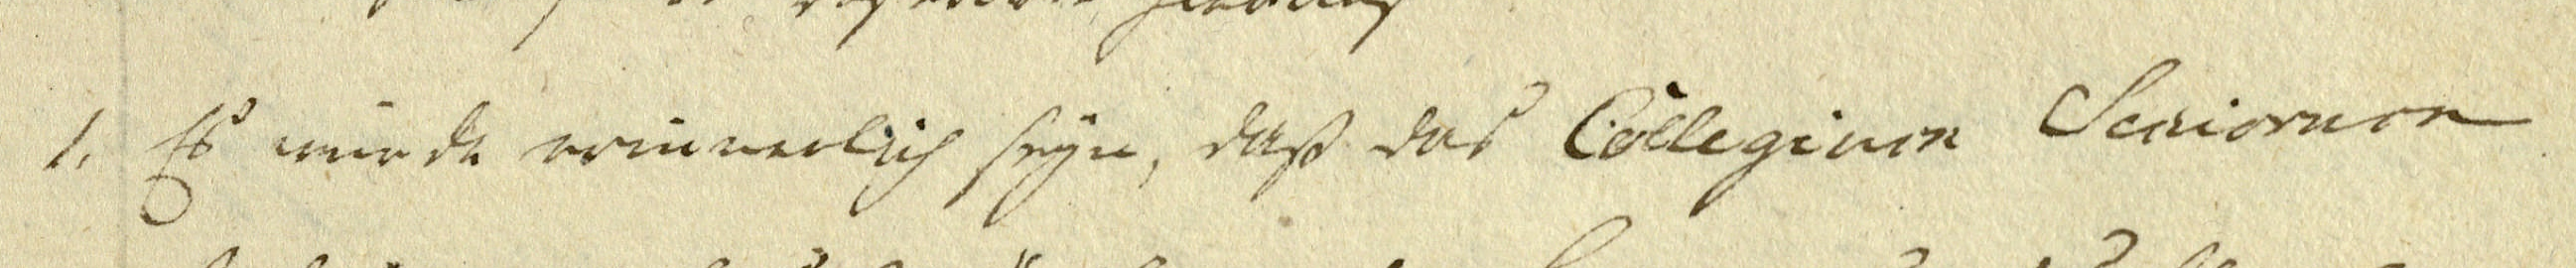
1. Es würde erinnerlich seÿn, daß das Collegium Seniorum
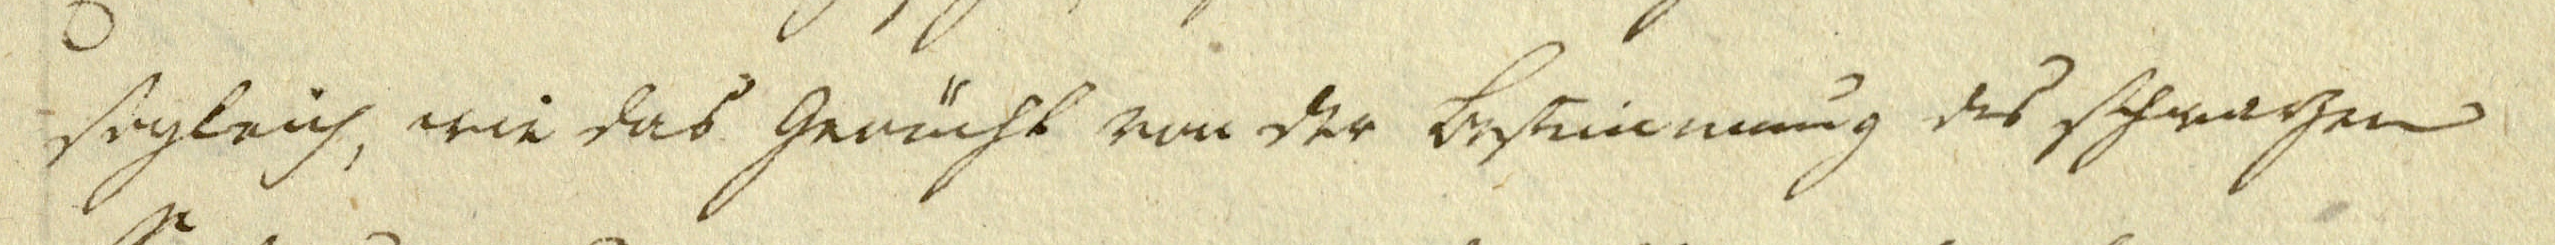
sogleich, wie das Gerücht von der Bestimmung des schwarzen
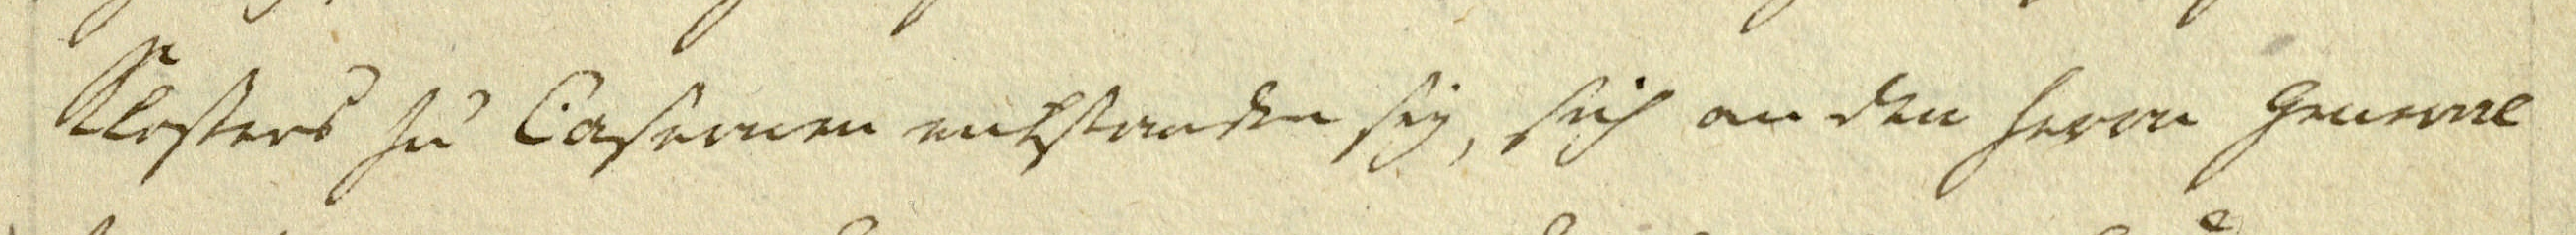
Klosters zu Casernen entstanden seÿ, sich an den Herrn General
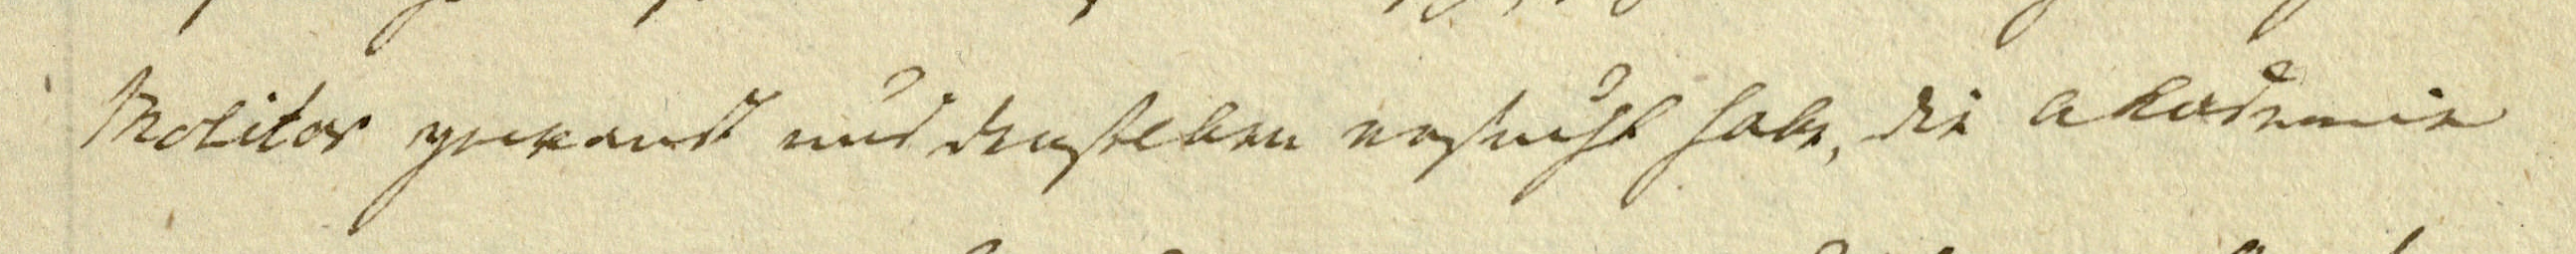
Molitor gewandt und denselben ersucht habe, die Akademie
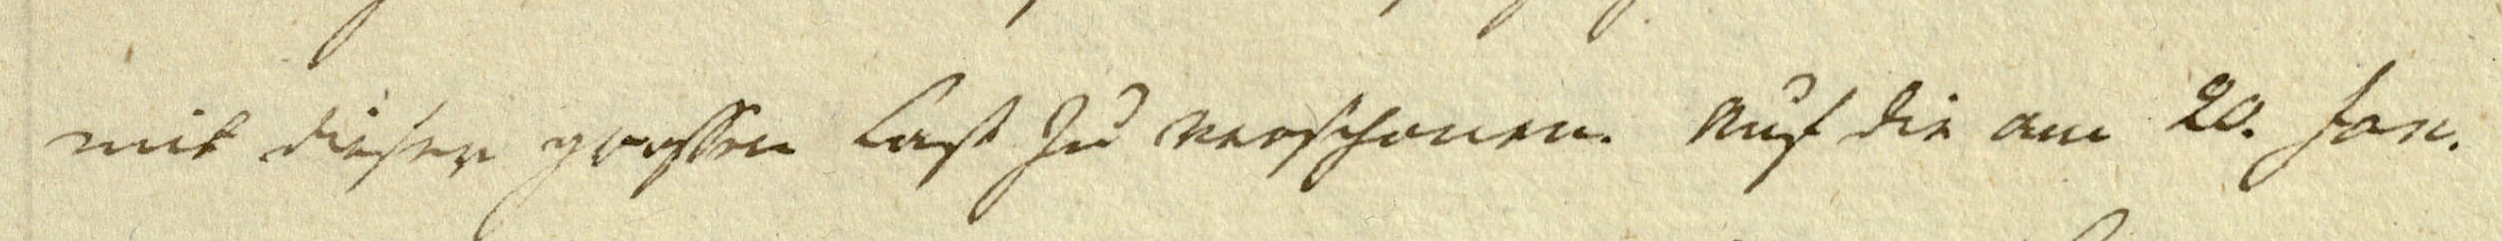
mit dieser grossen Last zu verschonen. Auf die am 20. Jan.
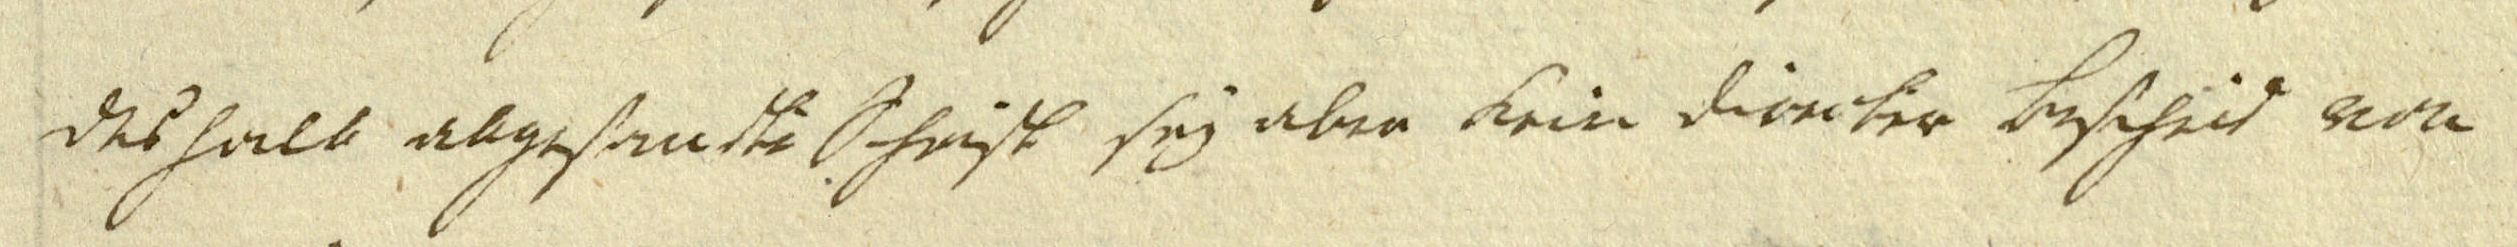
deshalb abgesandte Schrift seÿ aber kein directer Bescheid von
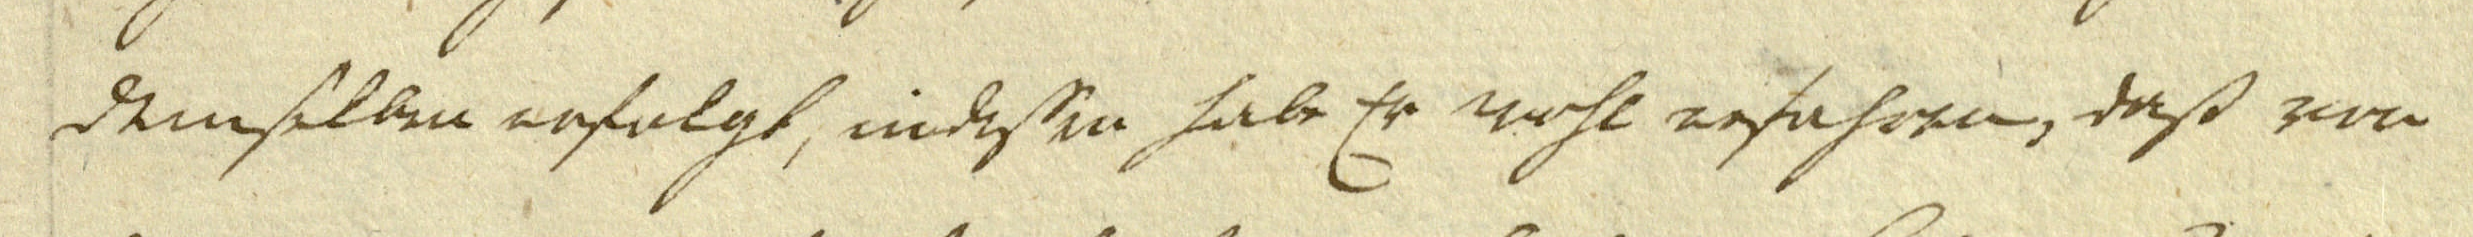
demselben erfolgt, indessen habe Er wohl erfahren, daß von
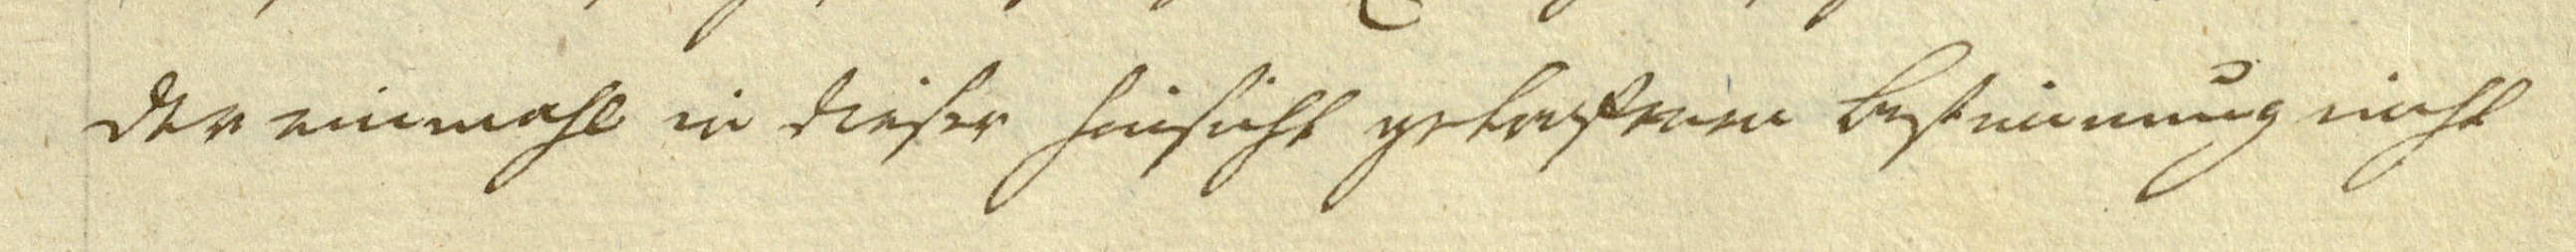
der einmahl in dieser Hinsicht getroffenen Bestimmung nicht
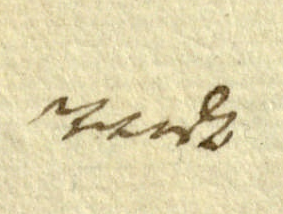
würde
